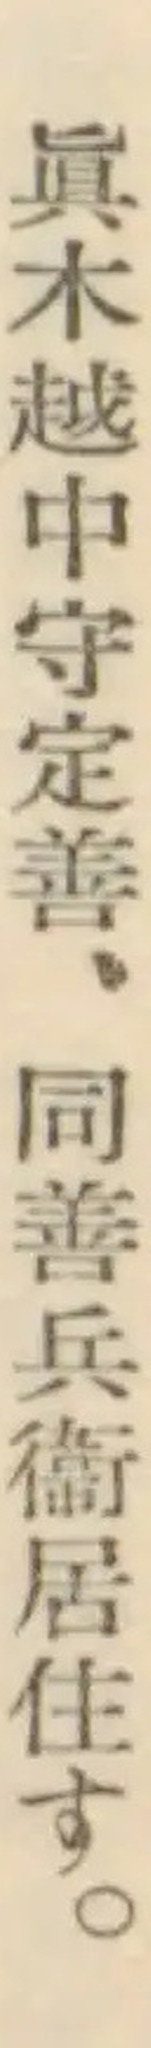真木越中守定善、同善兵衛居住す。
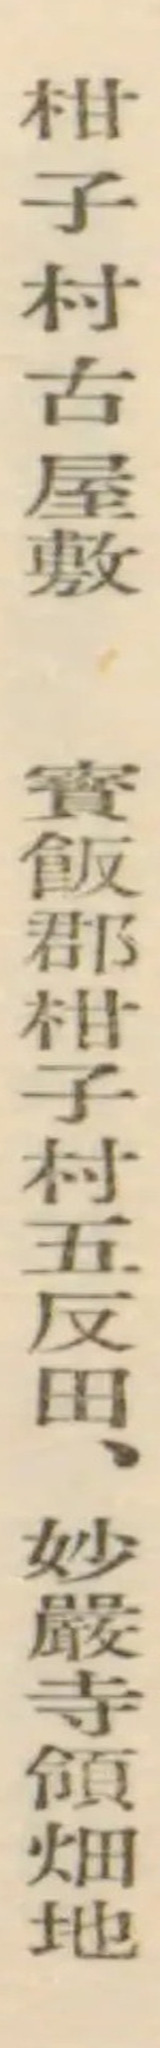柑子村古屋敷宝飯郡柑子村五反田、妙厳寺領畑地
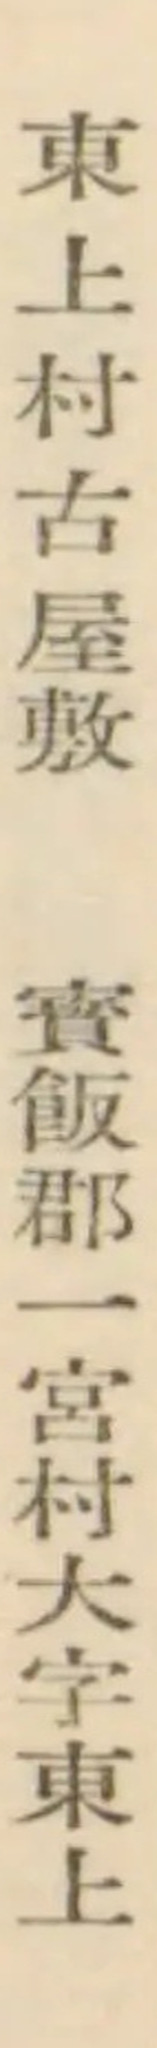東上村古屋敷宝飯郡一宮村大字東上

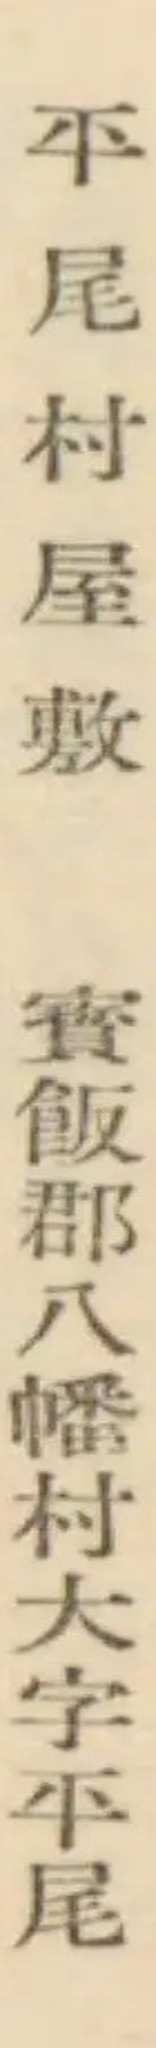平尾村屋敷宝飯郡八幡村大字平尾
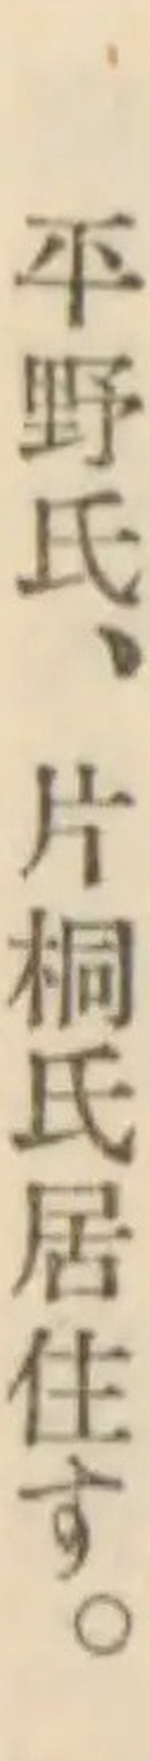平野氏、片桐氏居住す。
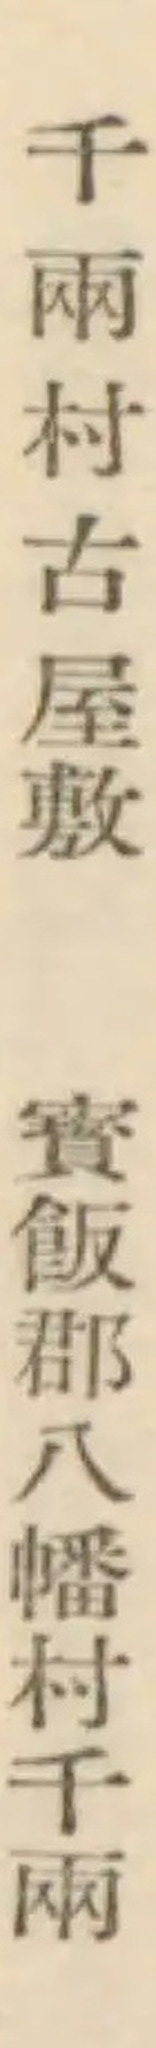千両村古屋敷宝飯郡八幡村千両
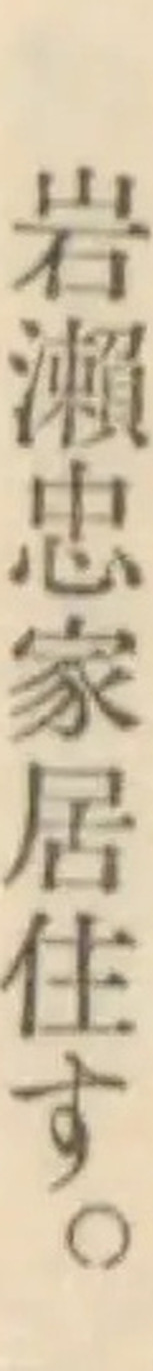岩瀬忠家居住す。
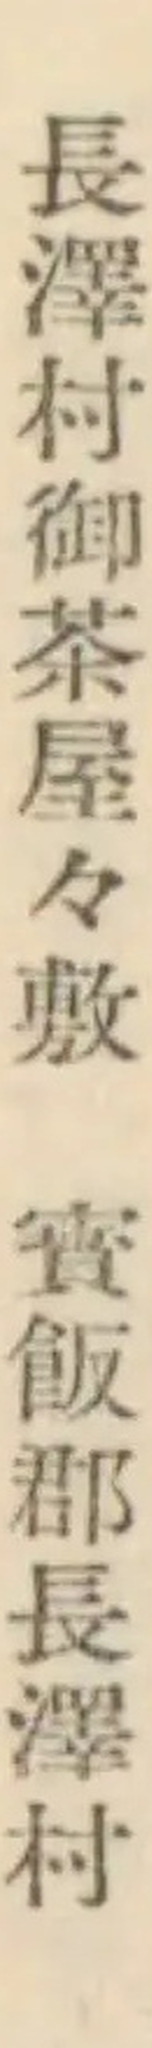長沢村御茶屋々敷宝飯郡長沢村
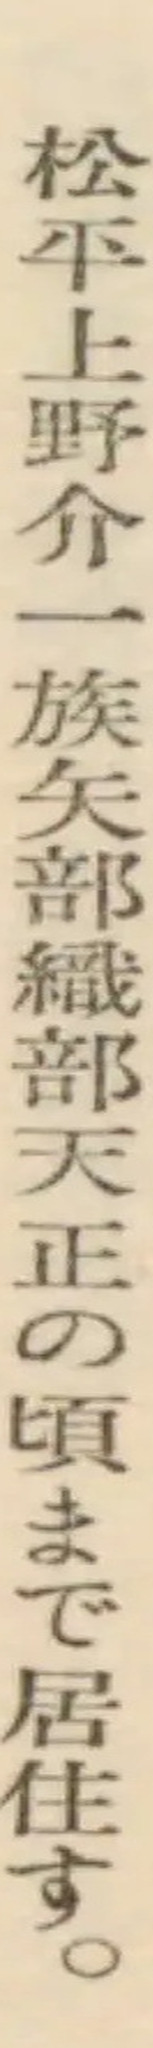松平上野介一族矢部織部天正の頃まで居住す。
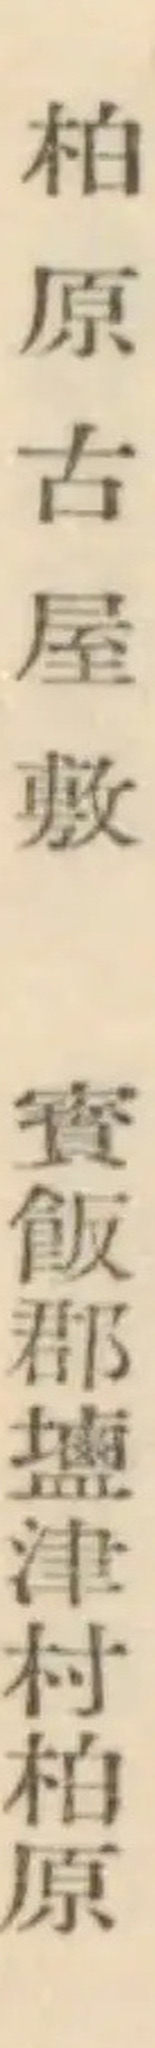柏原古屋敷宝飯郡塩津村柏原
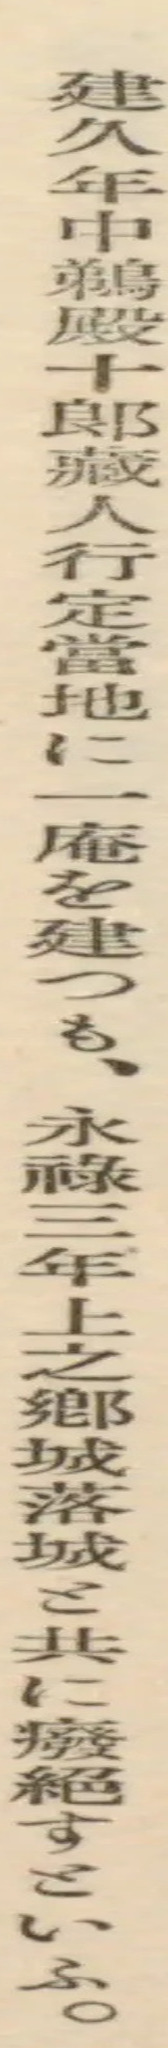建久年中鵜殿十郎蔵人行定当地に一庵を建つも、永禄三年上之郷城落城と共に廃絶すといふ。
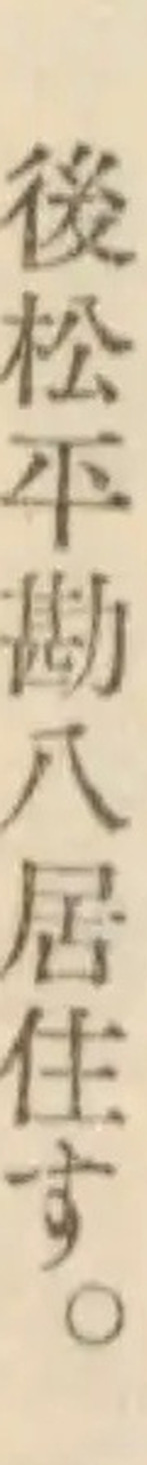後松平勘八居住す。
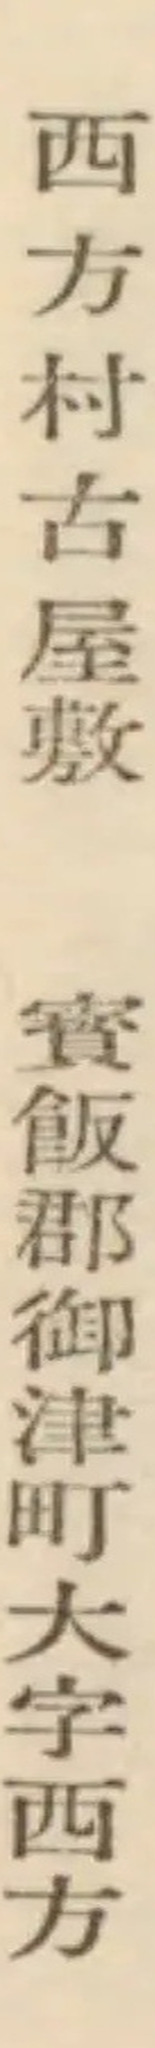西方村古屋敷宝飯郡御津町大字西方
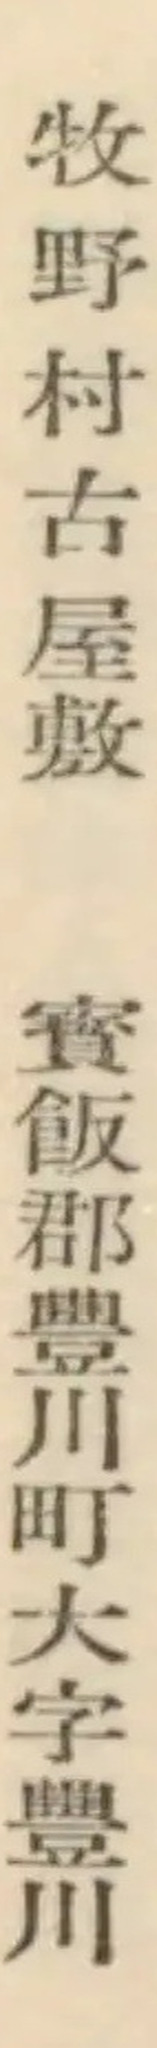牧野村古屋敷宝飯郡豊川町大字豊川
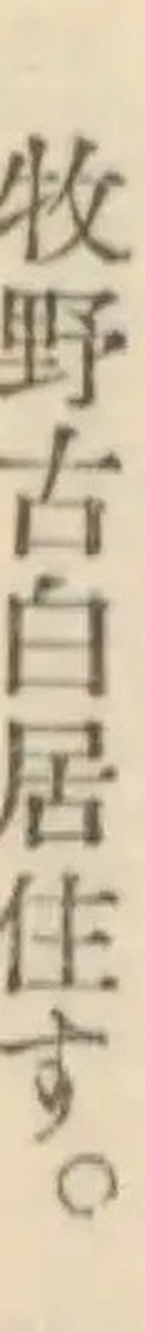牧野古白居住す。
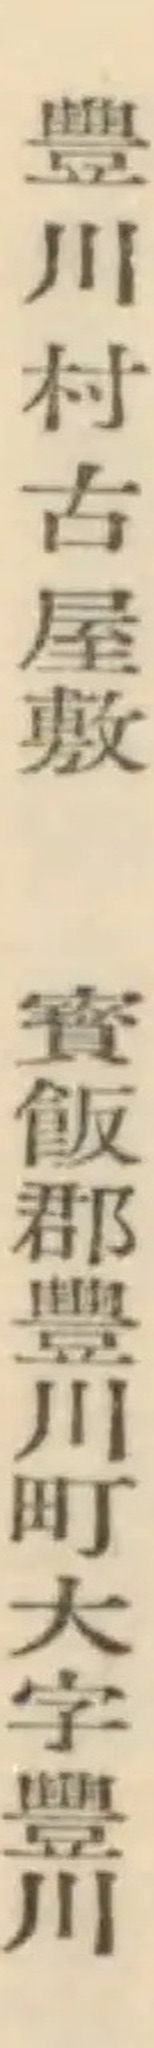豊川村古屋敷宝飯郡豊川町大字豊川
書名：東三河之古城
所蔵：国立国会図書館 National Diet Library, JAPAN
